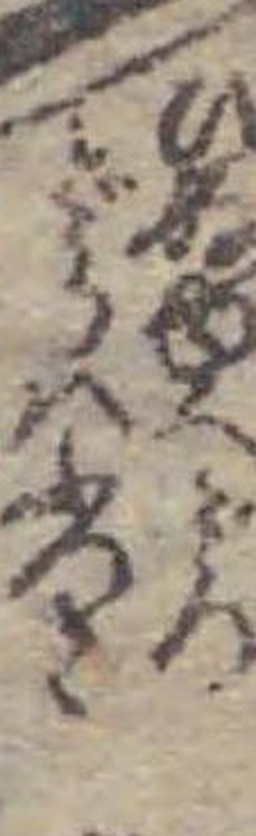どうはふつと
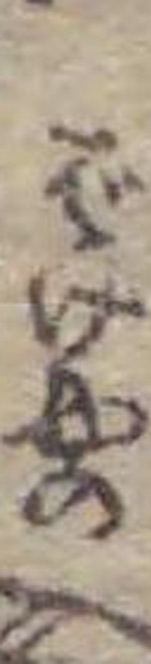ばけ物の
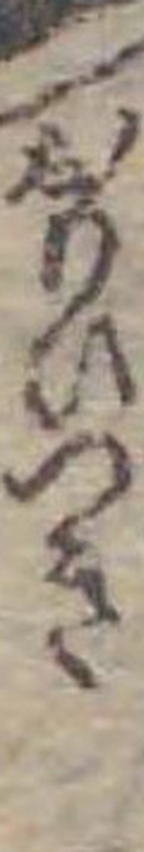おもひつき
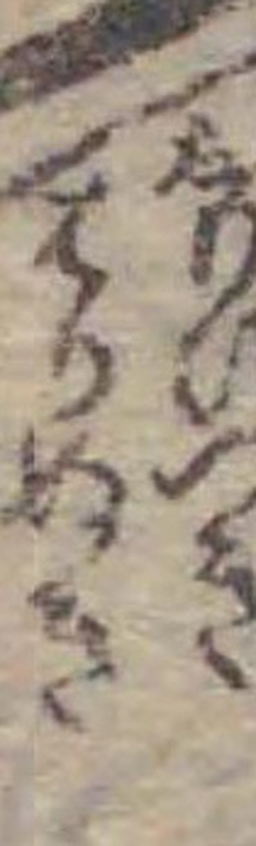はりぬき
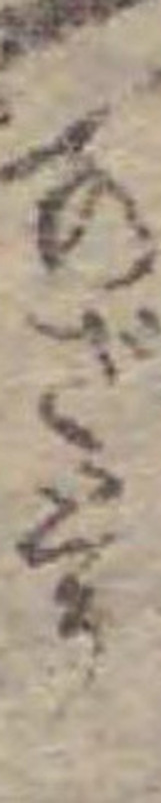のざとう
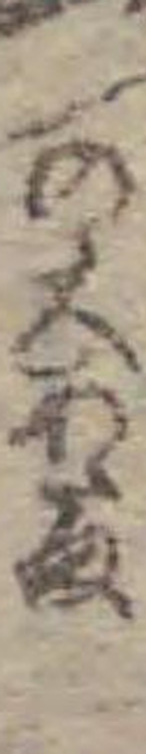の大あたま
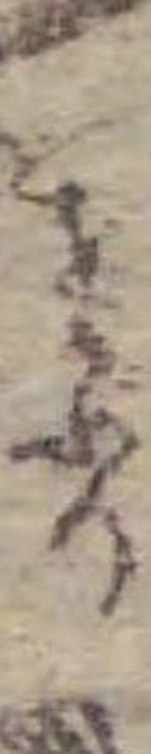をかふり
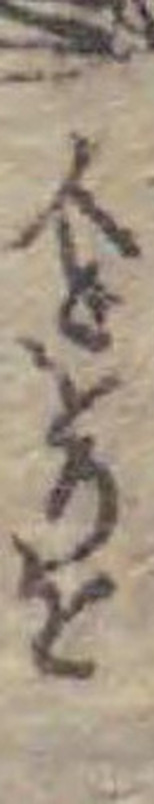人どをりを
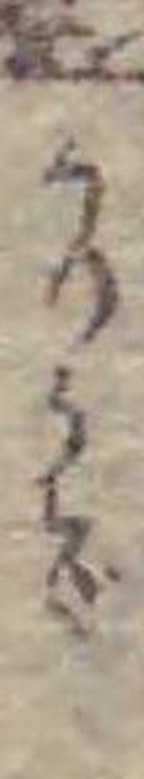かりうど
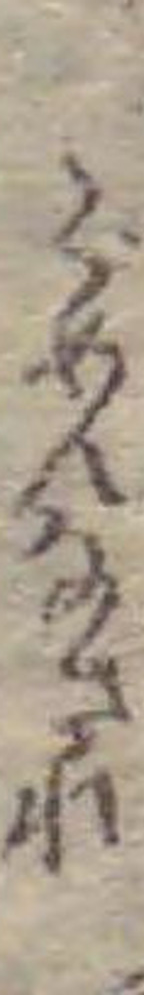ごめんなされ
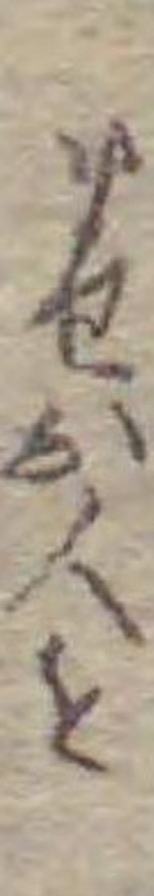ませお人を
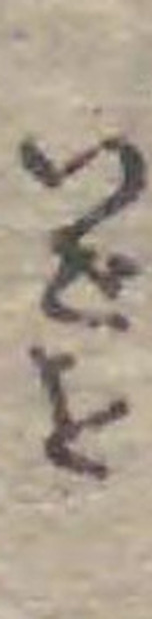いごを
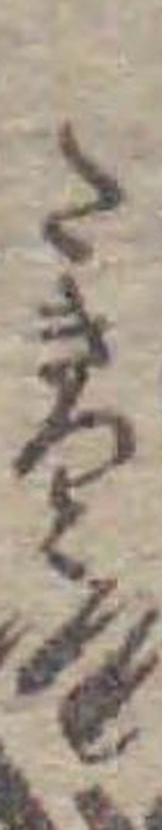たきつと
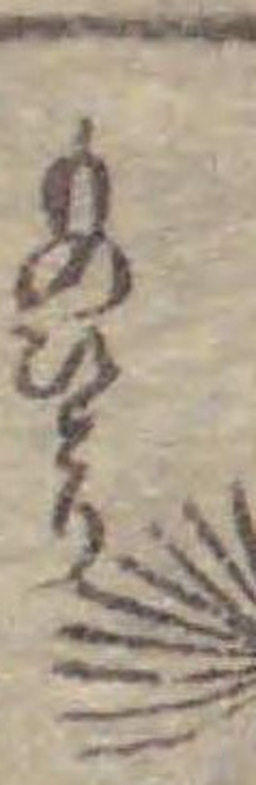ものひとり
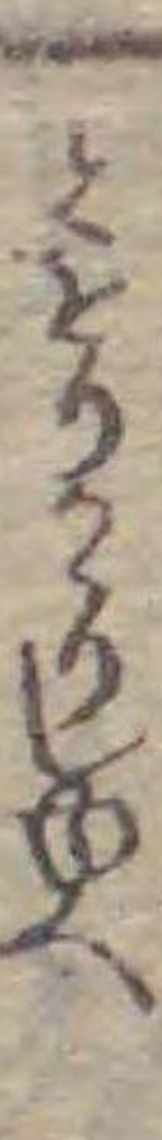とをりかゝりしゆへ
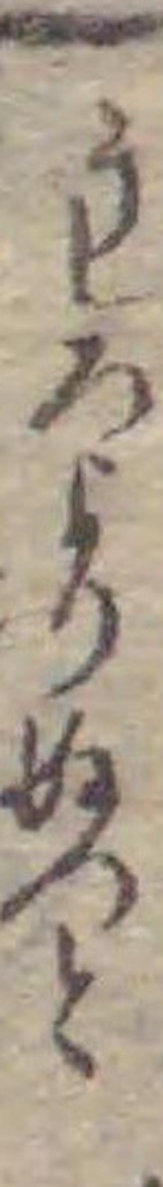うしろよりぬつと
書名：[化物一代記] : 5巻
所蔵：国立国会図書館 National Diet Library, JAPAN
